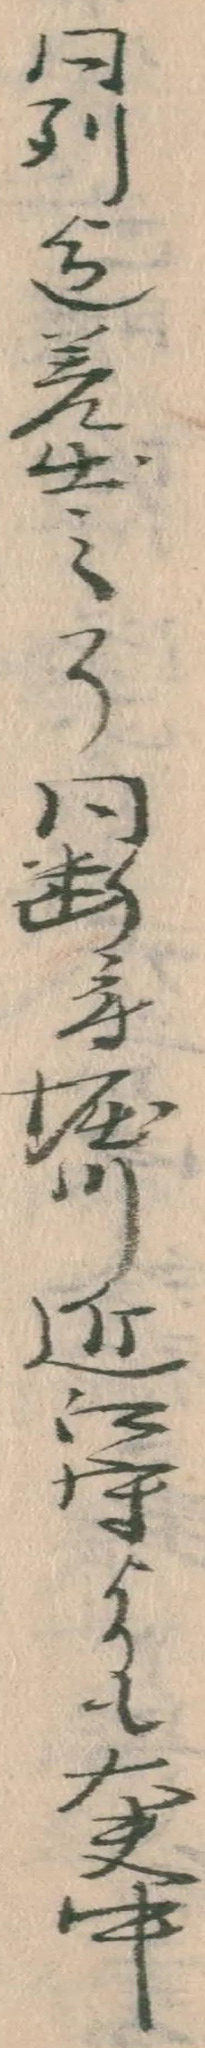同列迄差出之了同断ニ付堀川近江守よりも大夫中
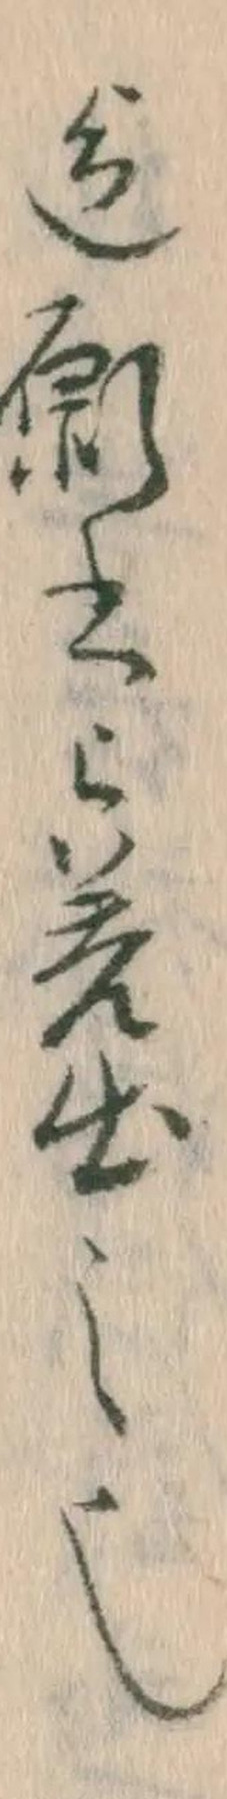迄願書被差出之也
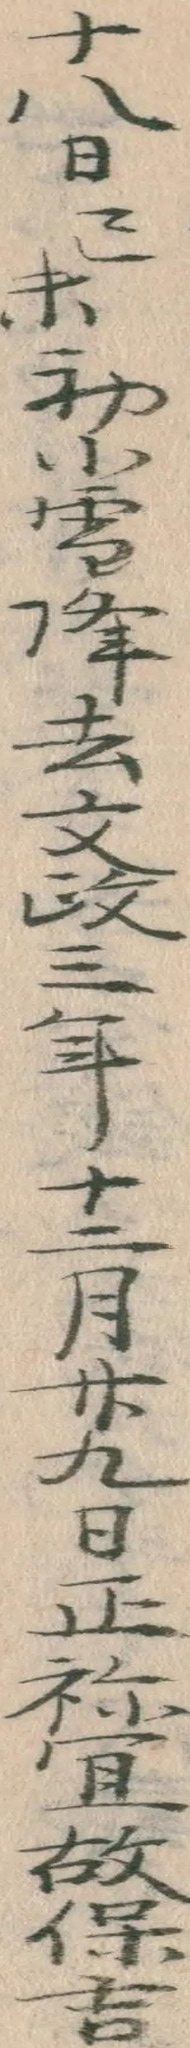十八日己未初小雪降去文政三年十二月廿九日正称宜故保吉
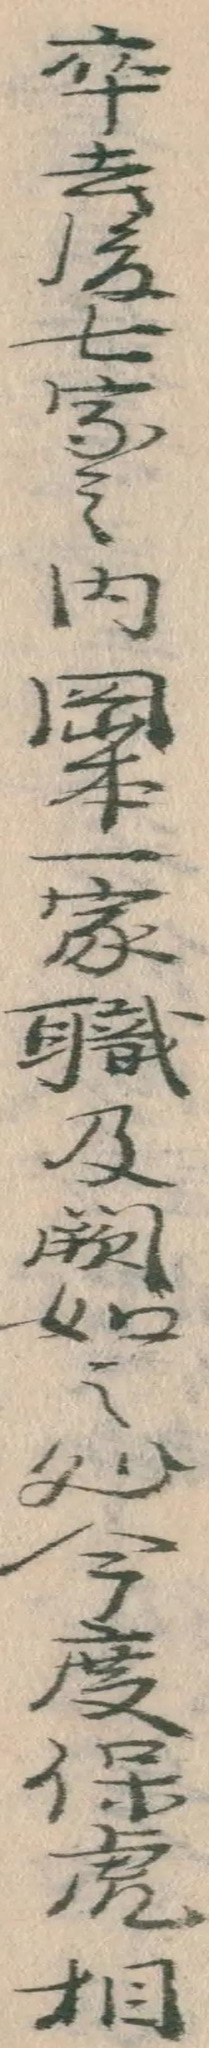卒去後七家之内岡本一家職及闕如之処今度保虎相
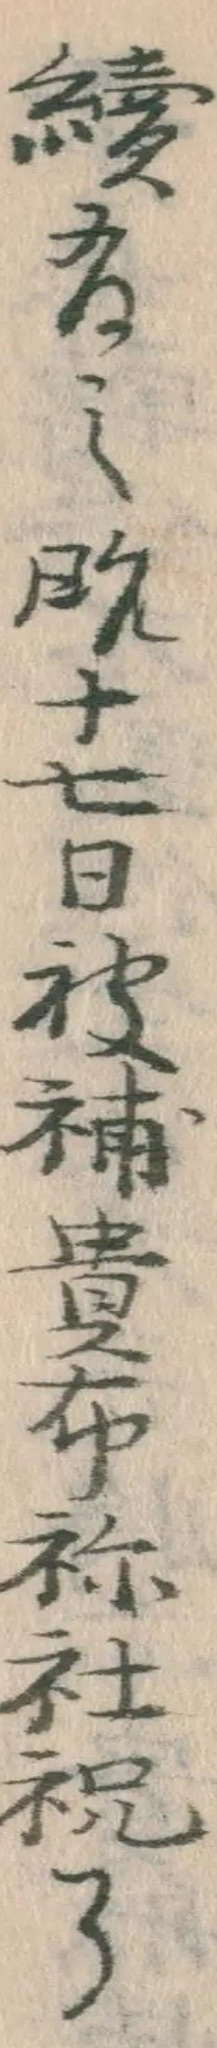續有之昨十七日被補貴布称社祝了
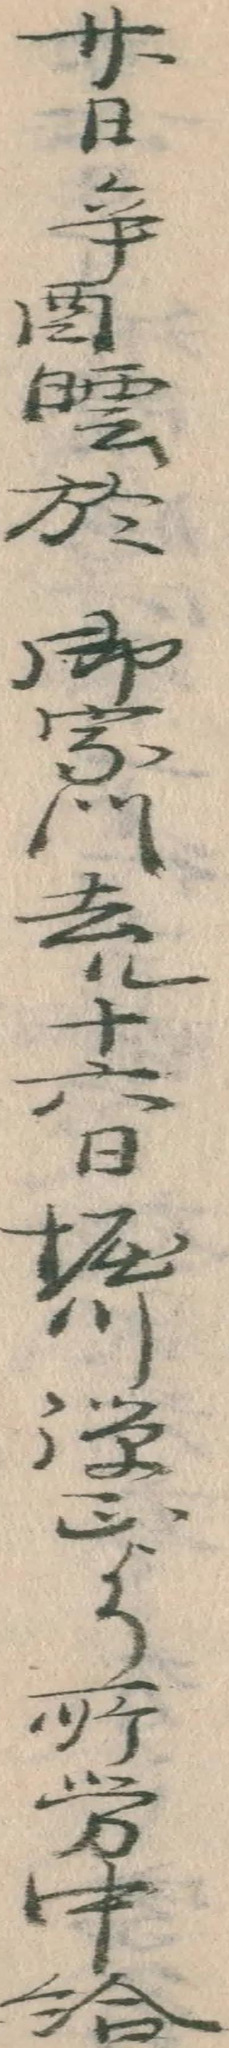廿日辛酉雲於御家門去ル十六日堀川弾正より所労中給
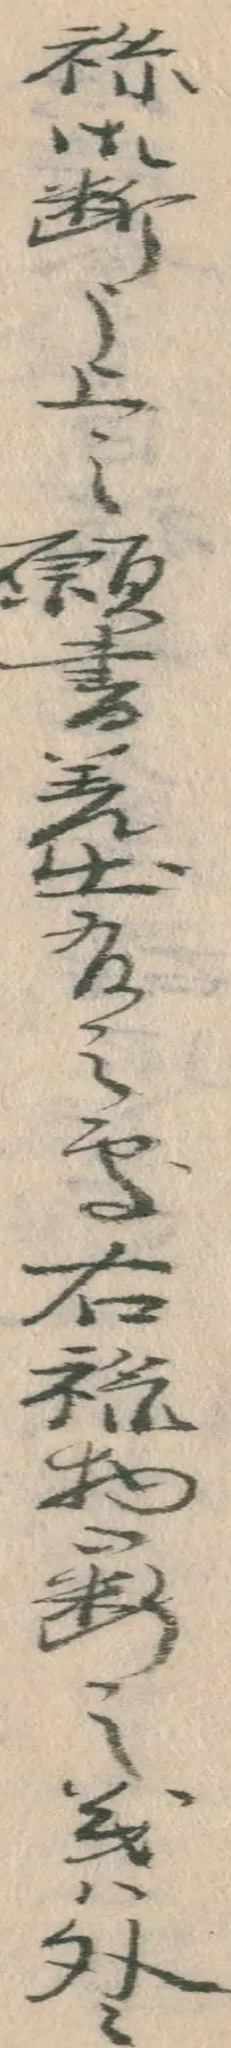禄御断申上之願書差出有之處右禄御断之義ハ外々
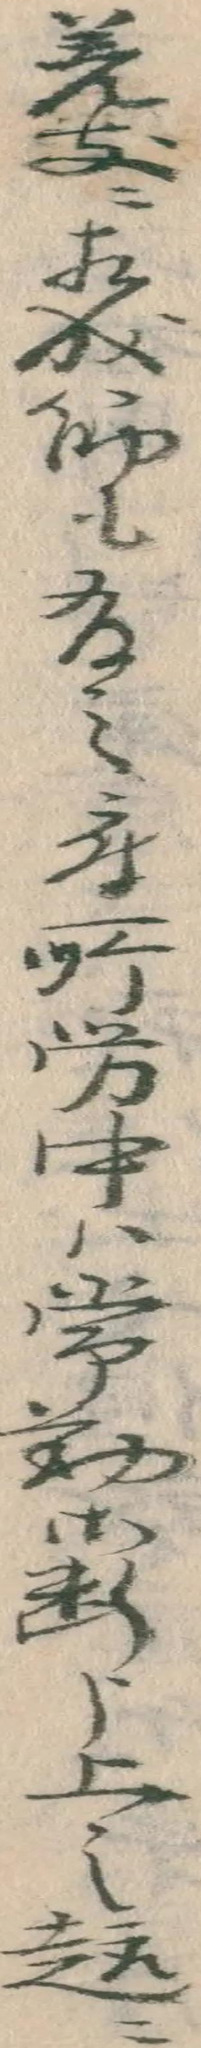差支ニ相成筋も有之ニ付所労中ハ常勤御断申上之趣ニ
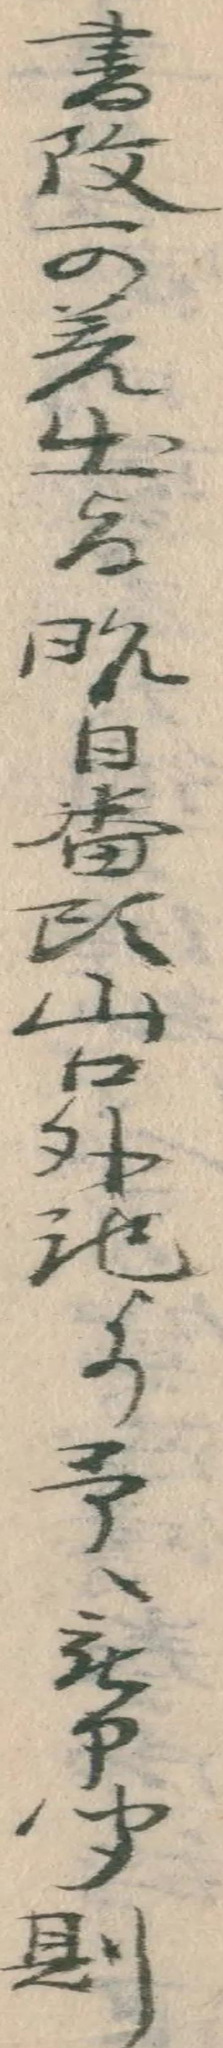書改可差出旨昨日番頭山口外記より予へ被申聞則
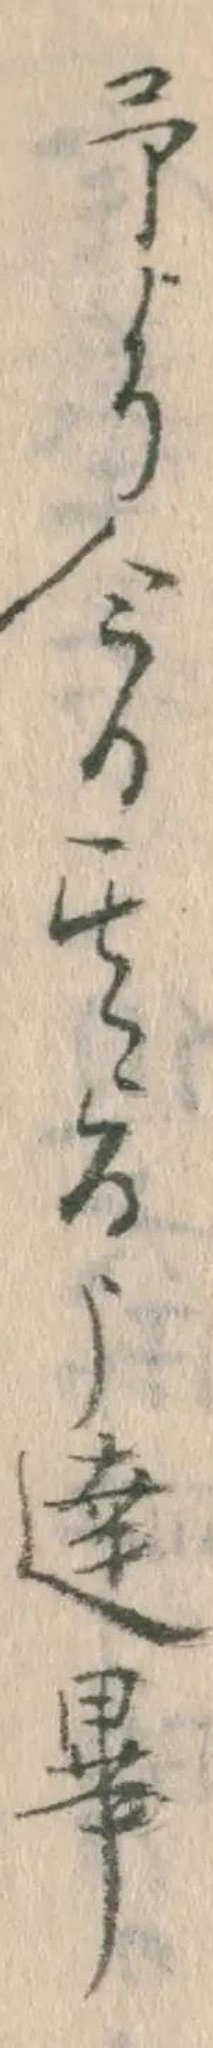予より今日其旨申達畢
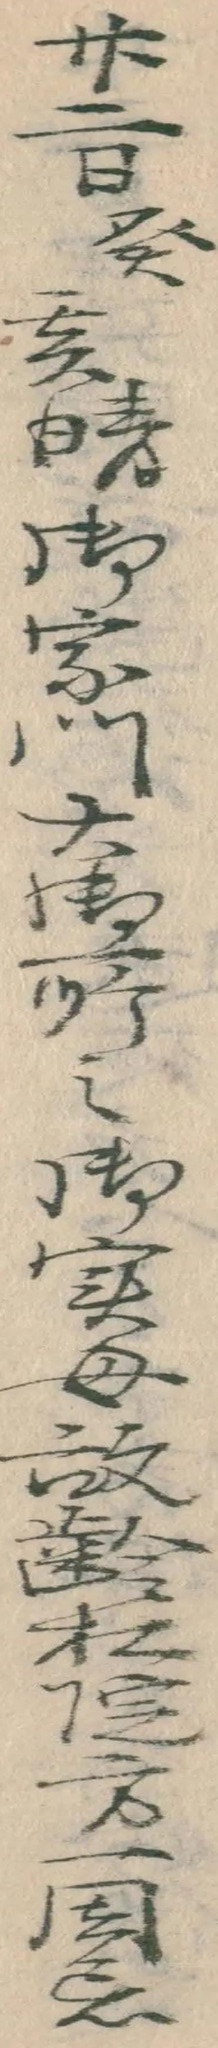廿二日癸亥晴御家門大御所之御実母故齢松院方一周忌
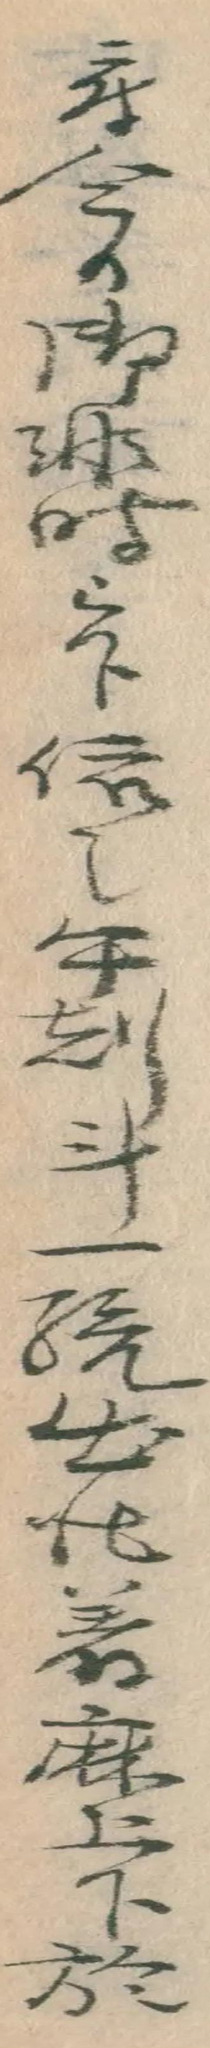二付今日御非時被下依之午刻斗一統出仕着麻上下於

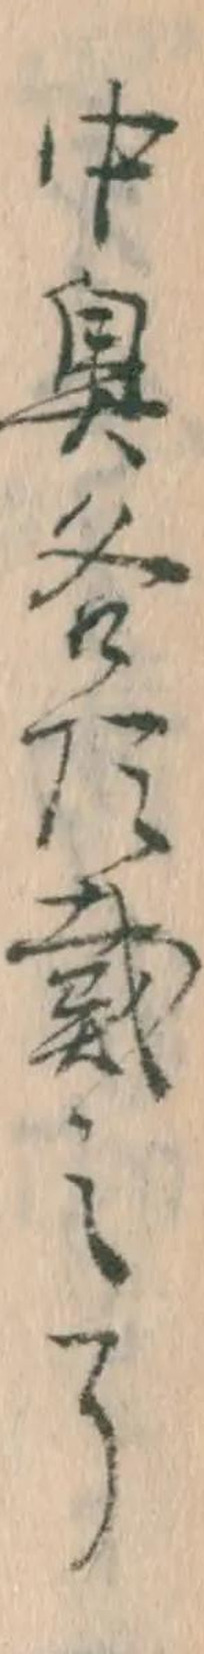中奥各頂戴之了
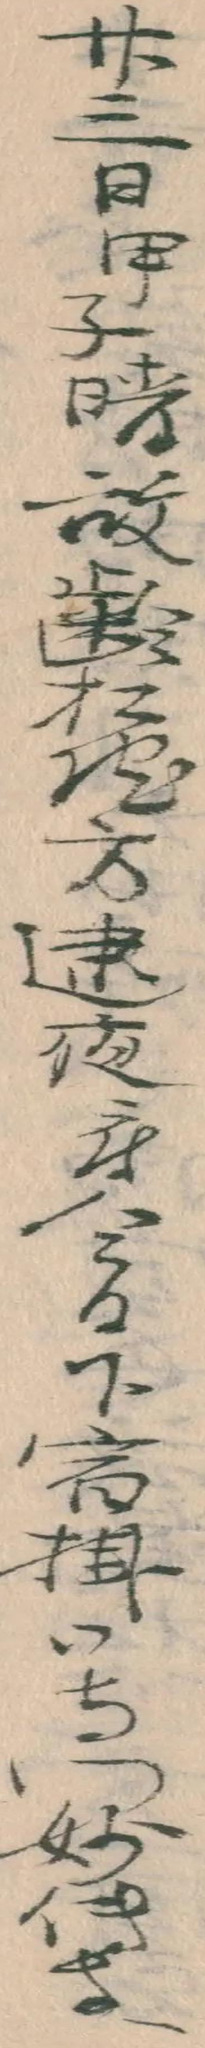廿三日甲子晴政故齢松沈方逮夜ニ付今日下宿掛御寺門妙儀寺へ
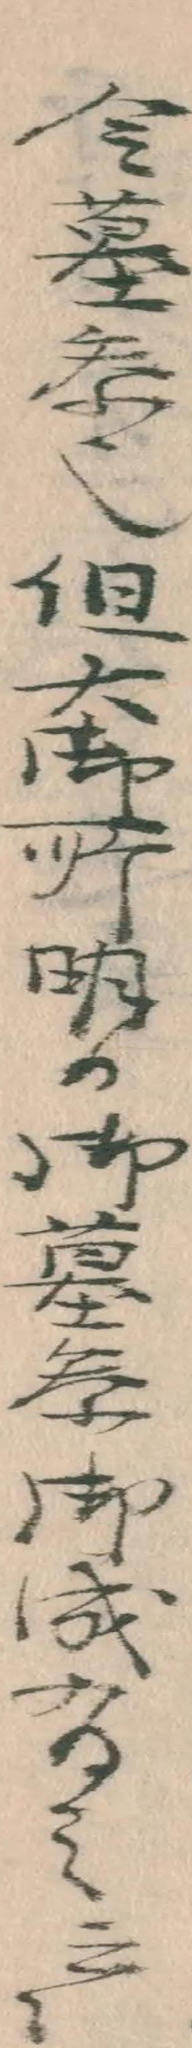令墓参也但大御所明日御墓参御成有之云々
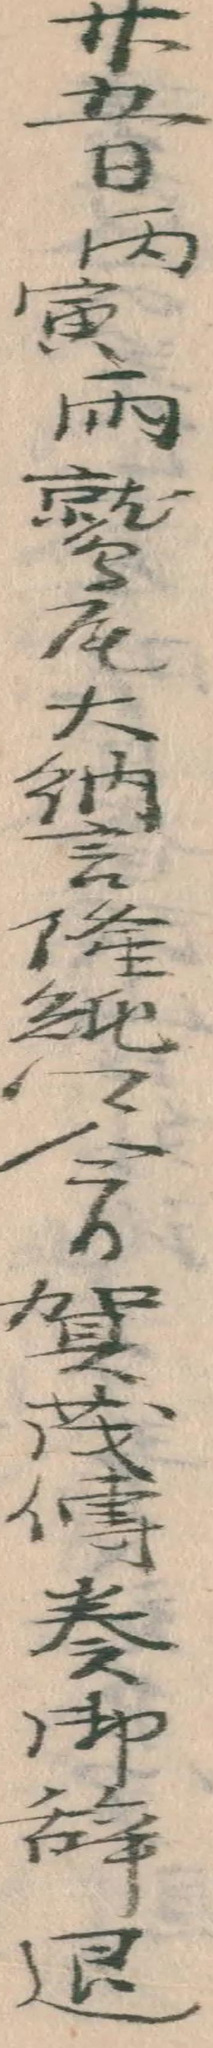廿五日丙寅雨鷲尾大納言隆純郷今日賀茂傳奏御辞退
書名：賀茂社記録. 第63冊
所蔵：国立国会図書館 National Diet Library, JAPAN
